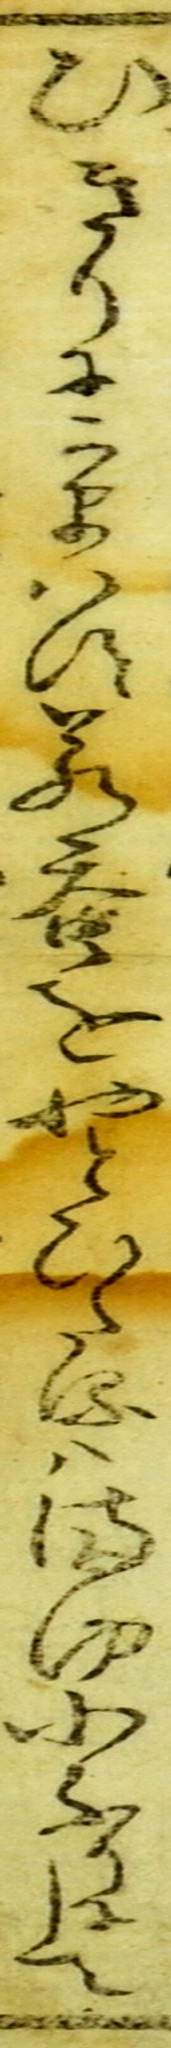ひきりにかまはす若蚕をやとひたるはまゆ小ふりにして
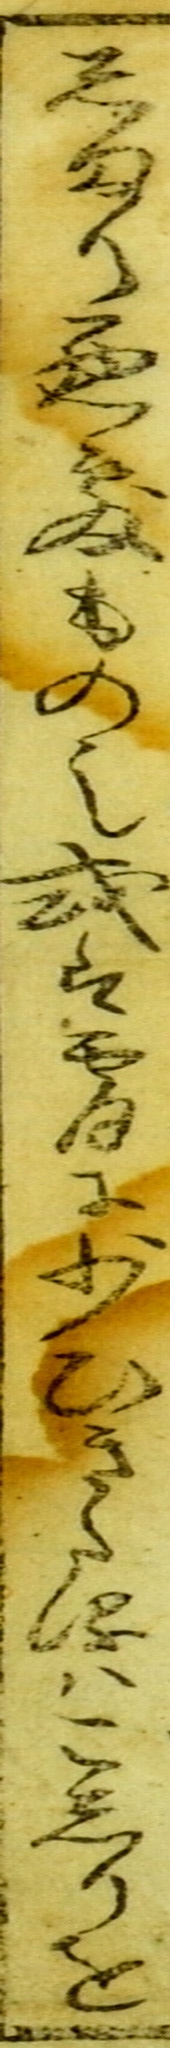しまり悪敷もの也或は宵に少ひきたるはこしりを
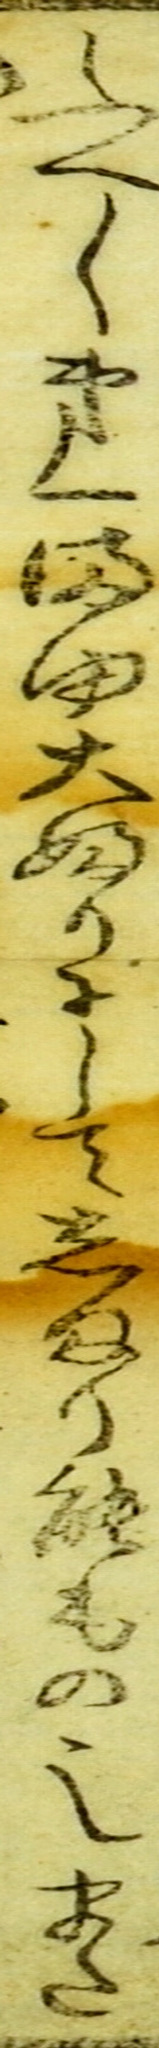しつへし第一まゆ大ふりにしてしまり能もの也また

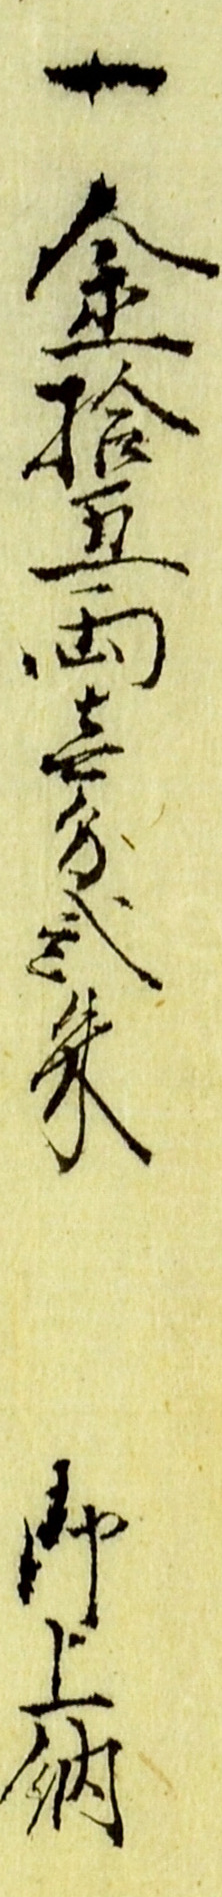一金拾五両壱分弐朱御上納
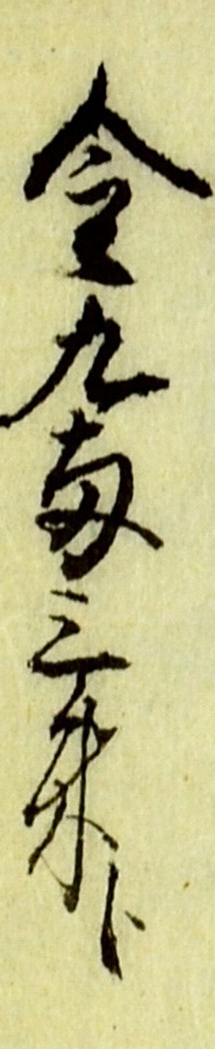金九両三朱ト
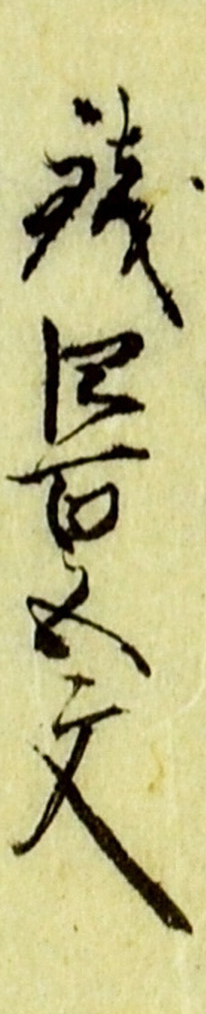銭四百五文
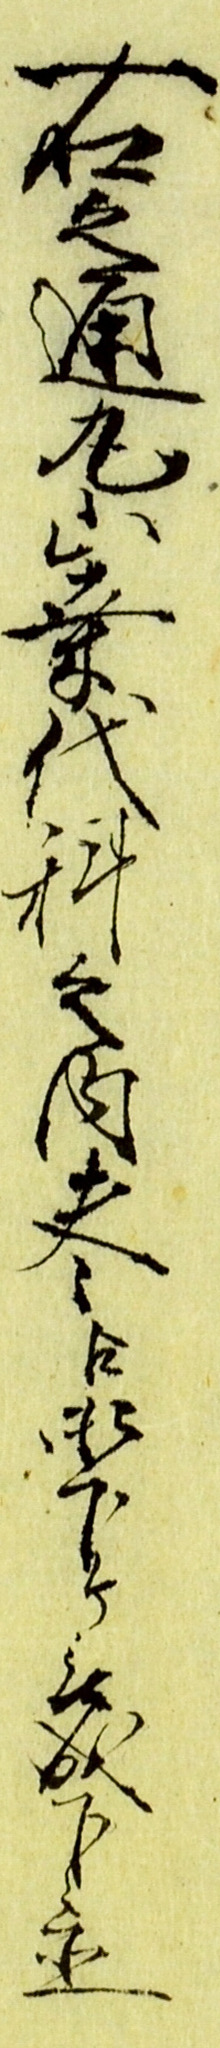右之通丸山桑代料之内夫々え払下ヶ被成下置
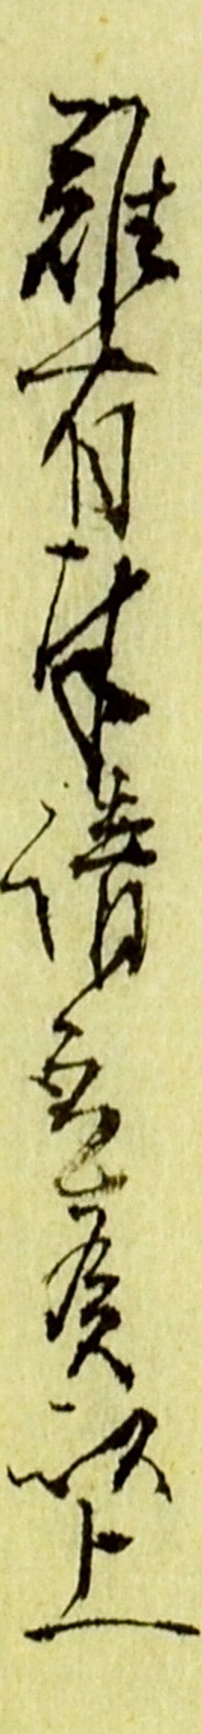難有奉請取候以上
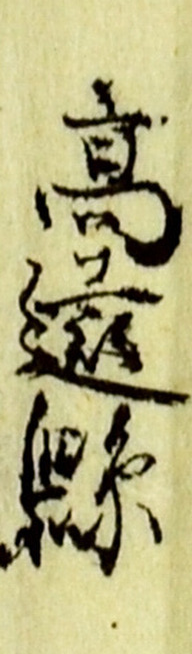高遠県
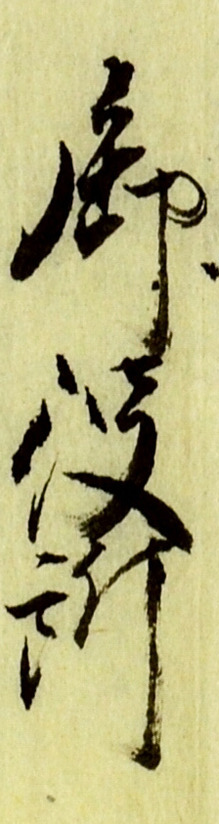御役所
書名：覚
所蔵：伊那市立高遠町図書館・合同会社AMANE
